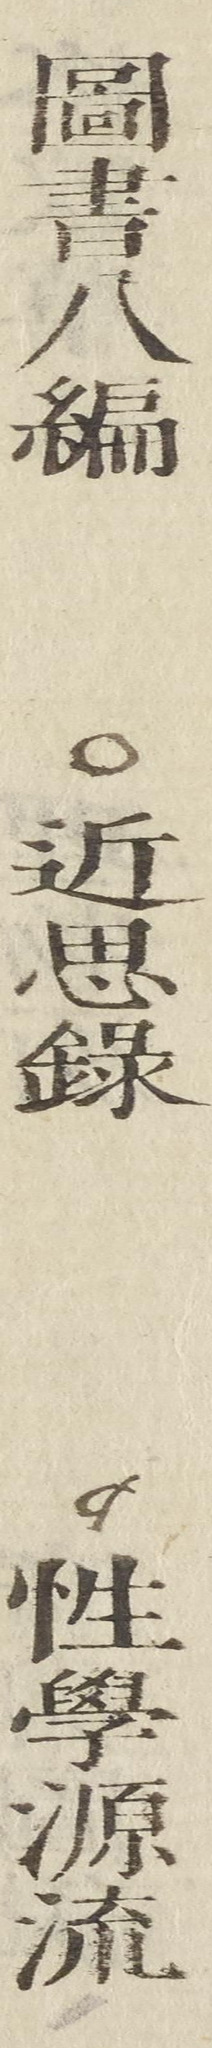図書八編○近思録性学源流
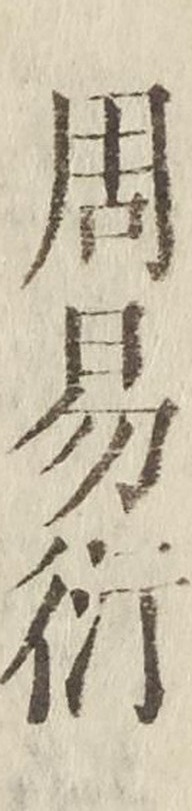周易衍
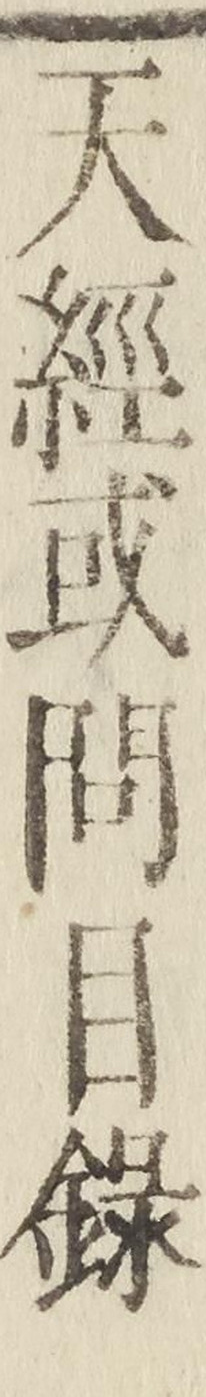天経或問目録
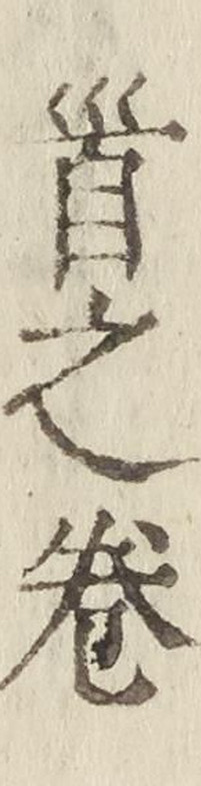首之巻
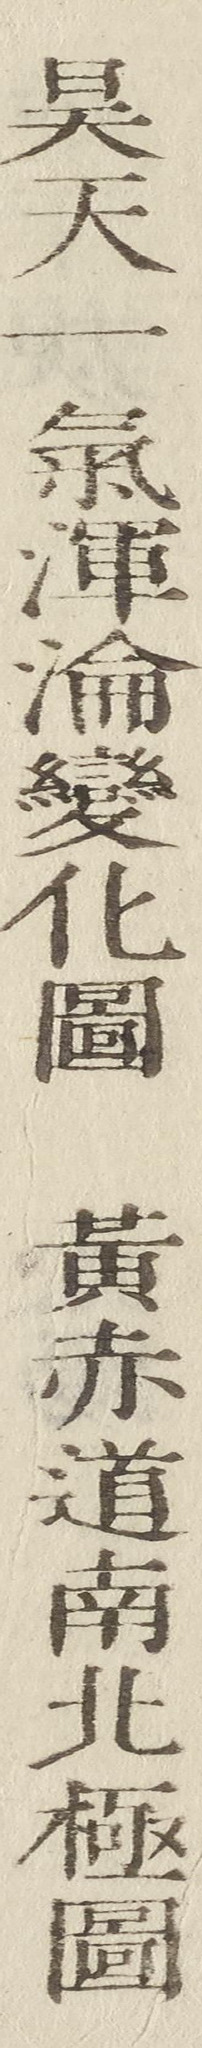昊天一気渾淪変化図黄赤道南北極図
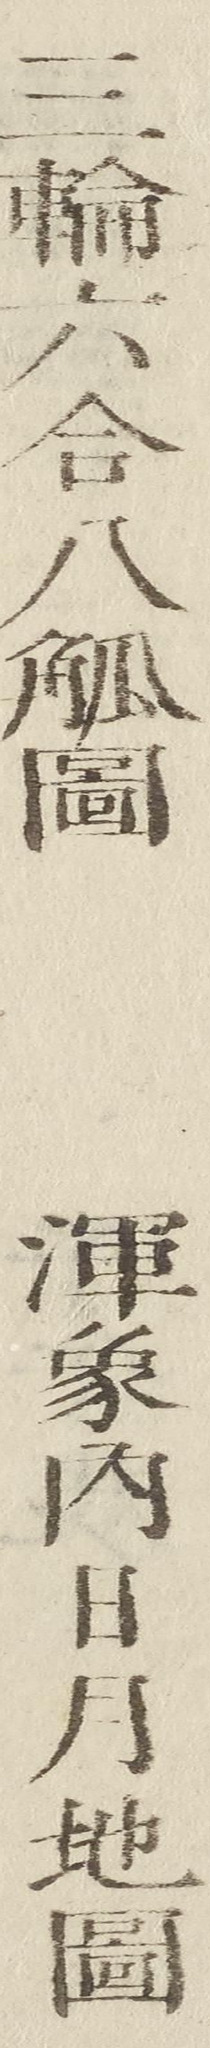三輪六合八觚図渾象内日月地図
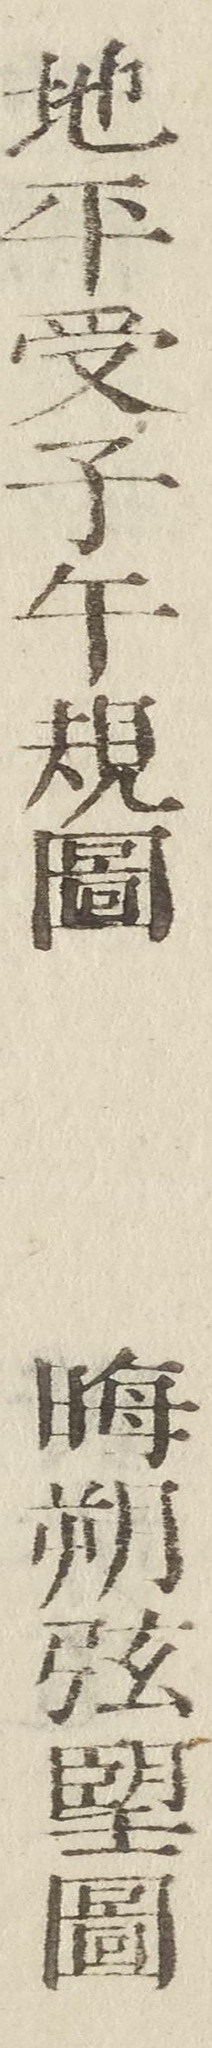地平受子午規図晦朔弦望図
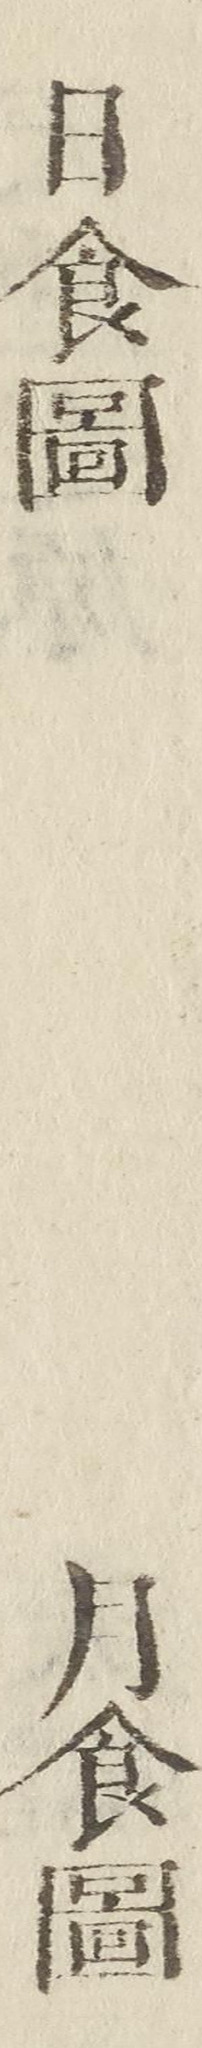日食図月食図
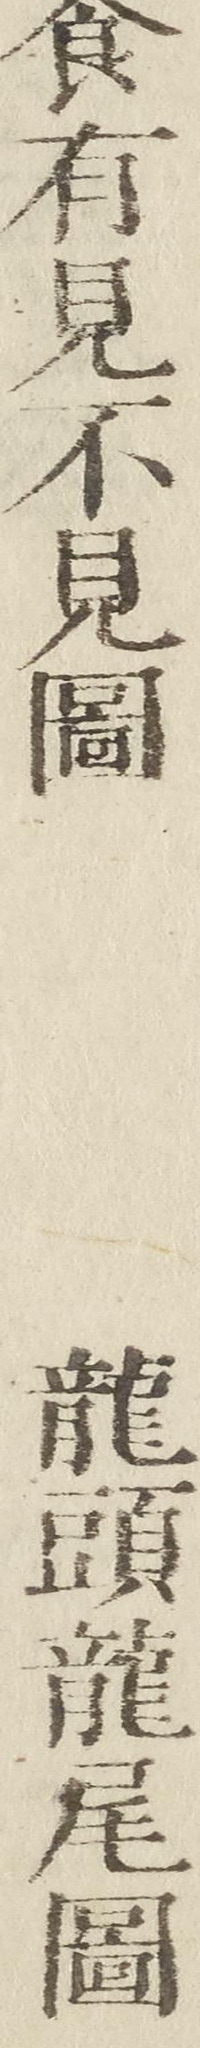食有見不見図竜頭竜尾図
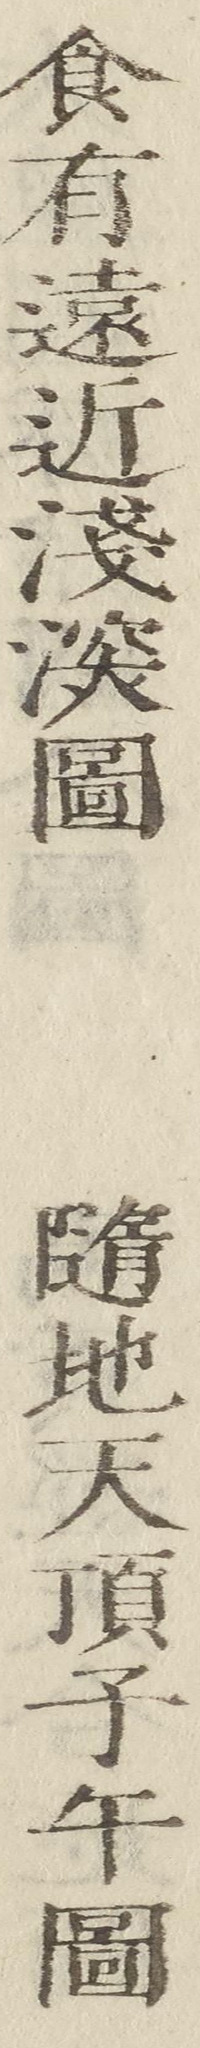食有遠近浅深図随地天頂子午図
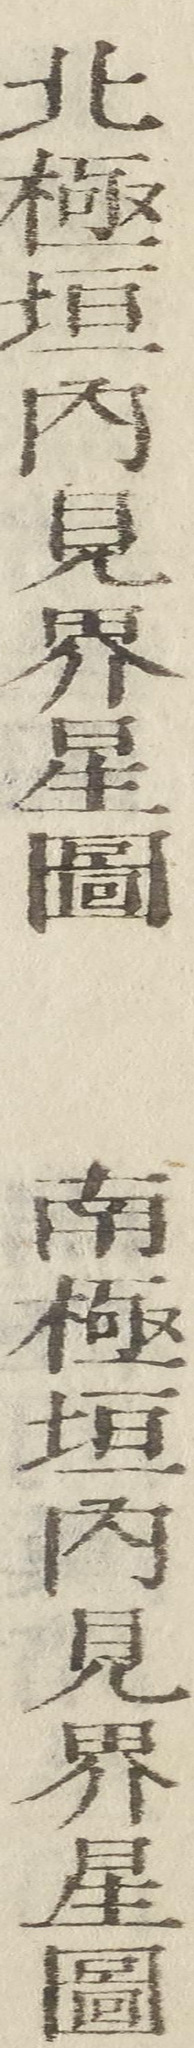北極垣内見界星図南極垣内見界星図
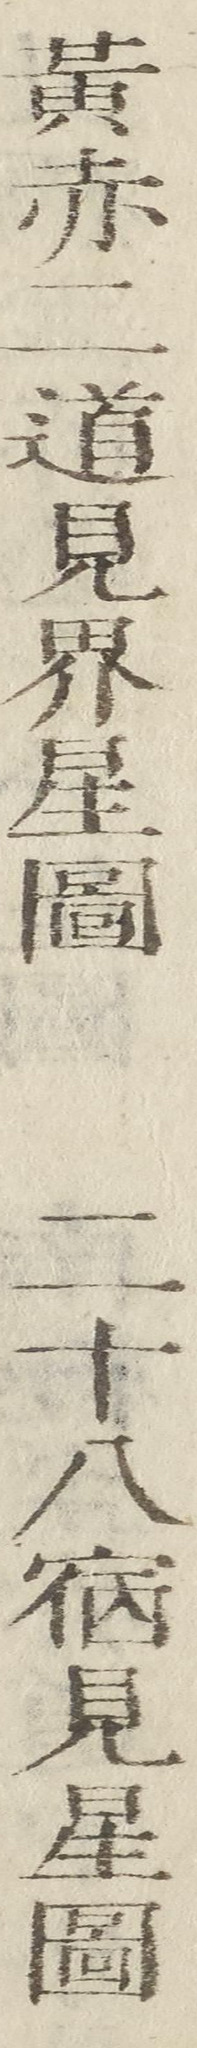黄赤ニ道見界星図二十八宿見星図
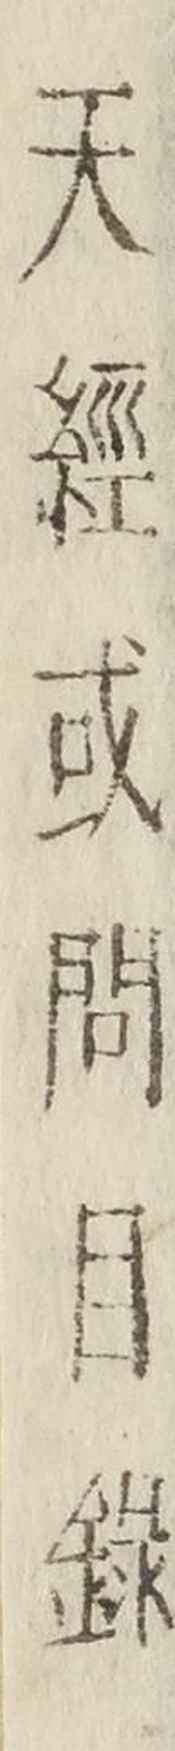天経或問目録

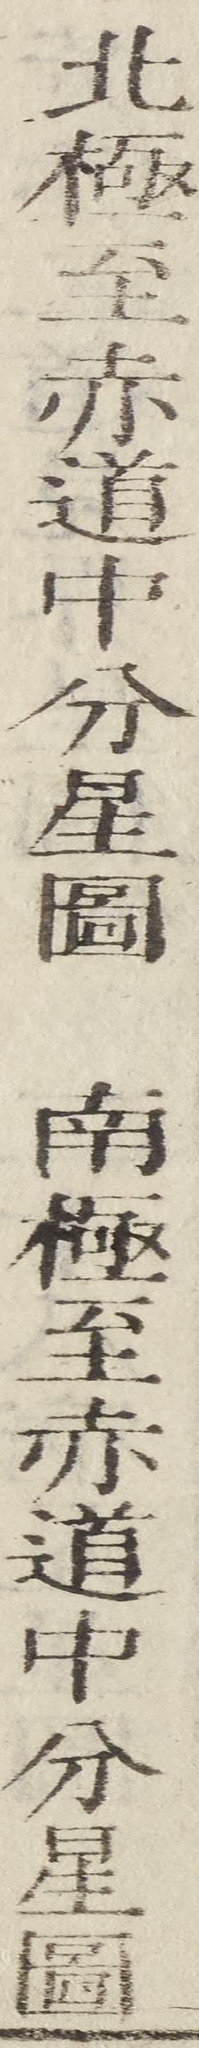北極至赤道中分星図南極至赤道中分星図
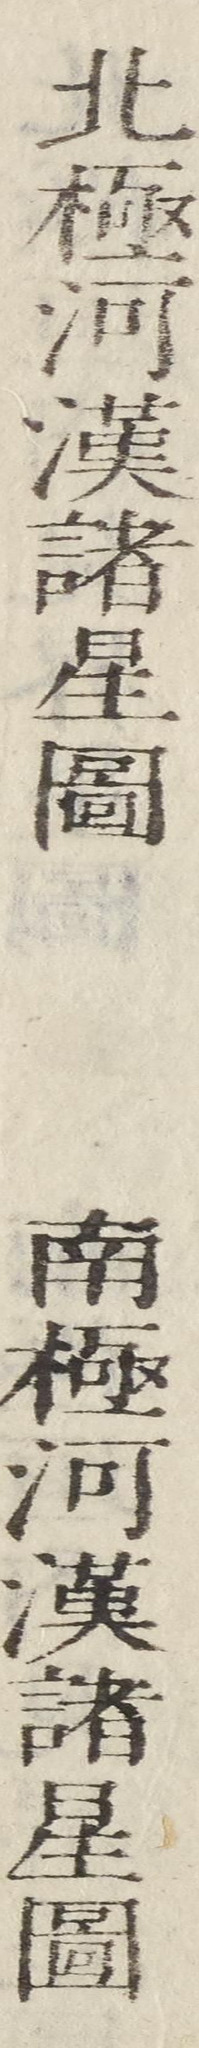北極河漢諸星図南極河漢諸星図
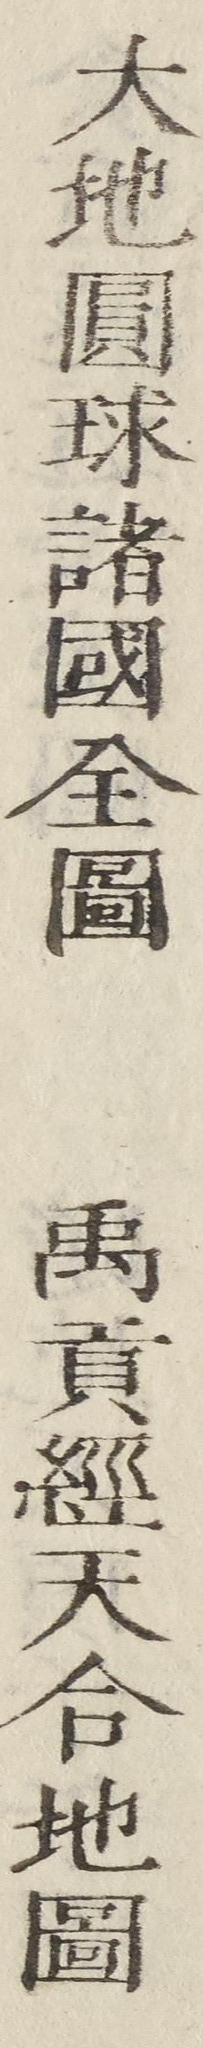大地円球諸国全図禹貢経天合地図
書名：天經或問　序圖
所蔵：東京大学地震研究所図書室 Earthquake Research Institute Library, The University of Tokyo, JAPAN
